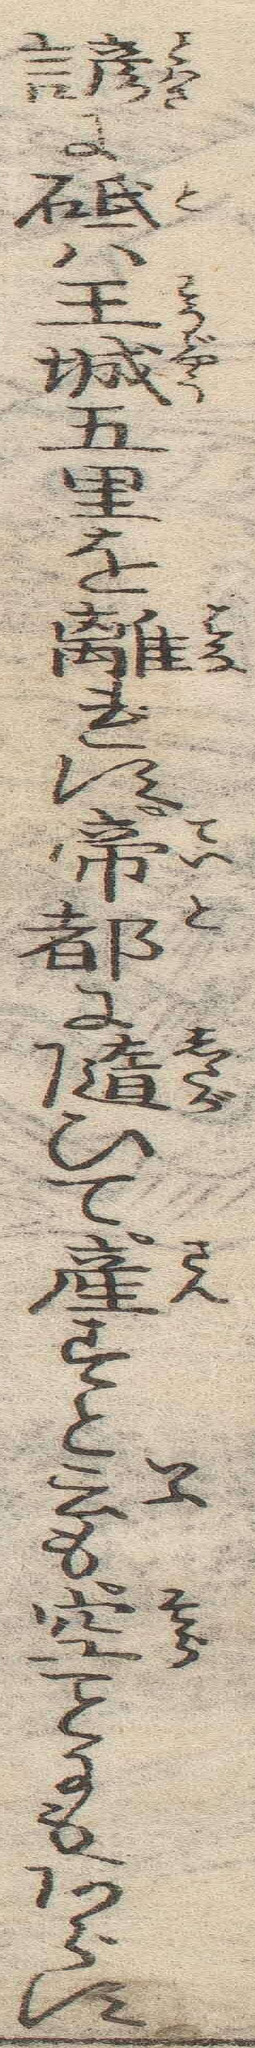諺に砥は王城五里を離れす。帝都に随ひて。産すと云も。空ことにもあらす
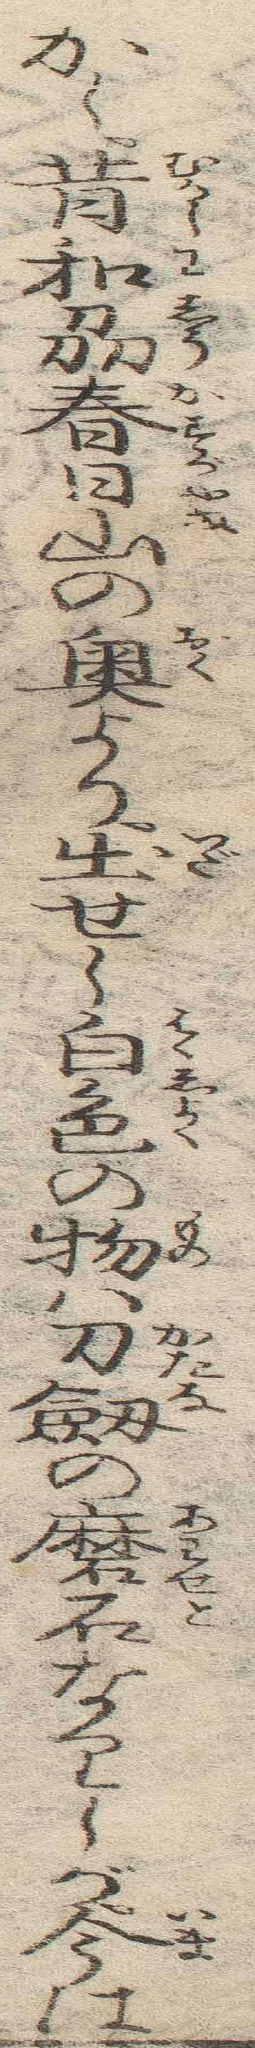かし。昔和州春日山の奥より。出せし白色の物は刀剣の磨石なりしが。今は
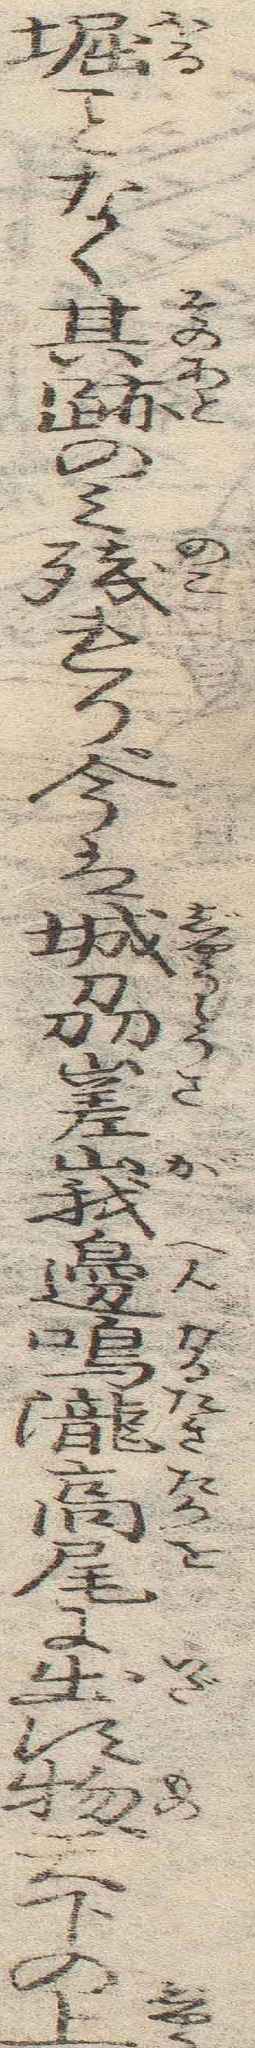掘ことなく其跡のみ残れり。今は城州嵯峨辺鳴瀧高尾に出す物。天下の上
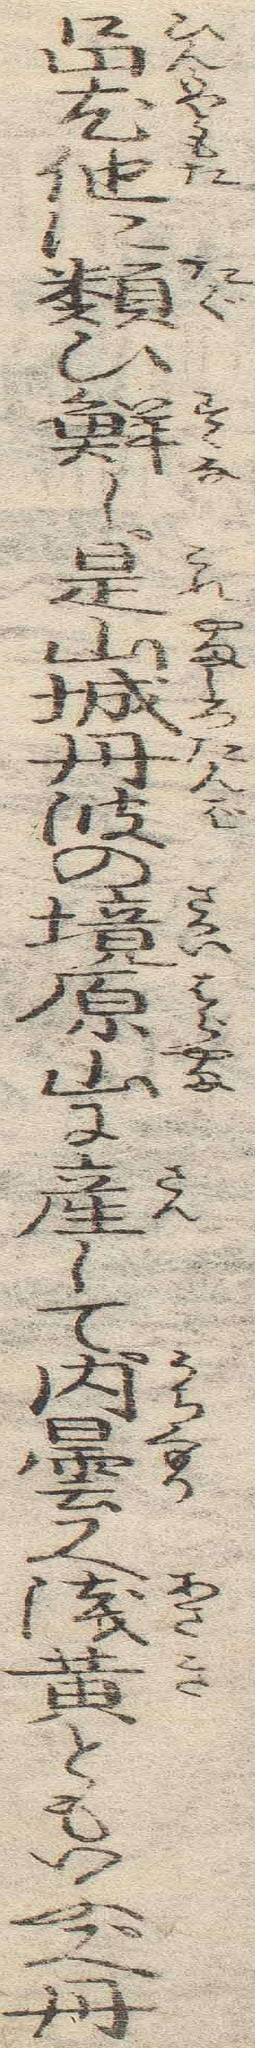品尤他に類ひ鮮し。是山城丹波の境原山に産して。内曇又浅黄ともいふ。又丹
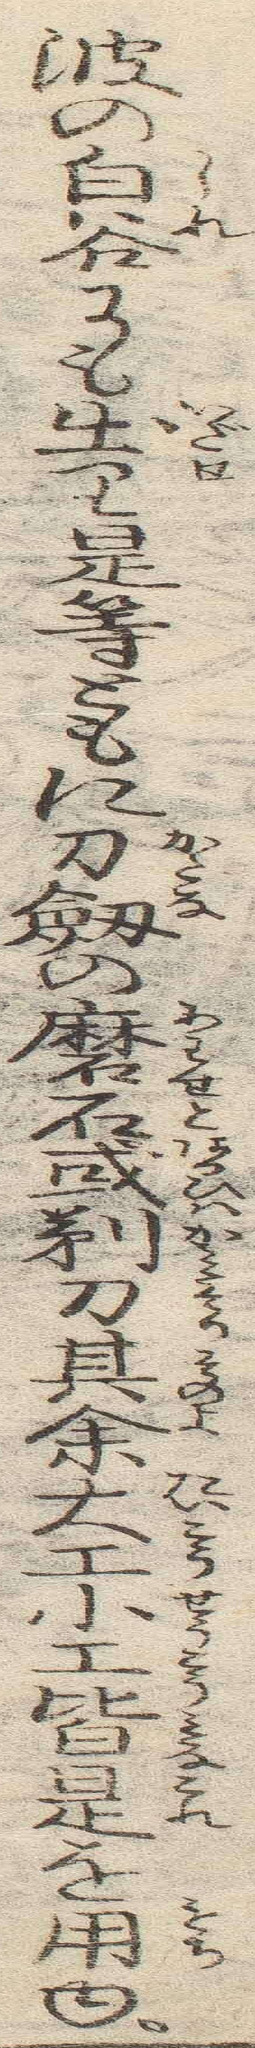波の白谷にも出り是等ともに刀剣の磨石或剃刀其余大工小工皆是を用ゆ。
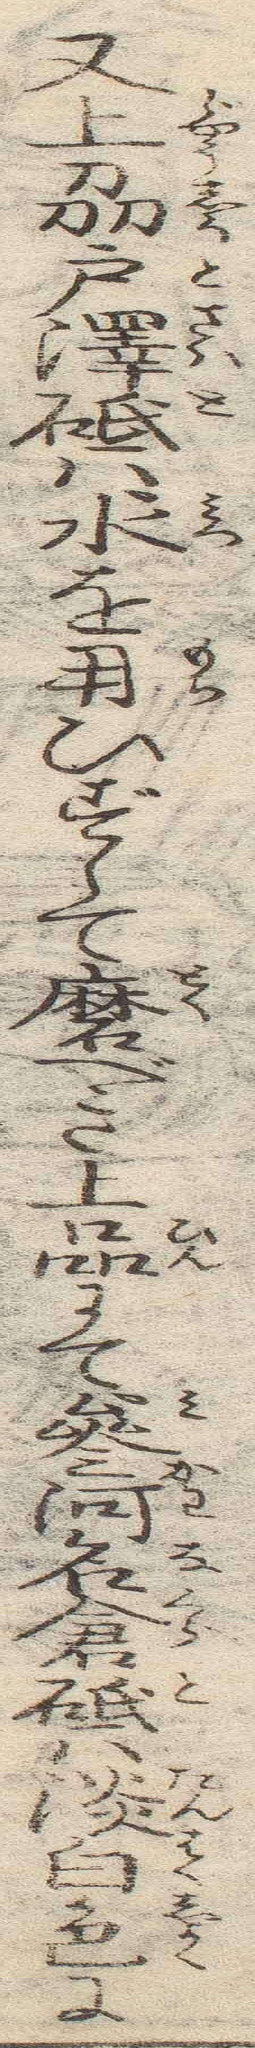又上州戸沢砥は。水を用ひずして磨べき上品にて。参河名倉砥は淡白色に
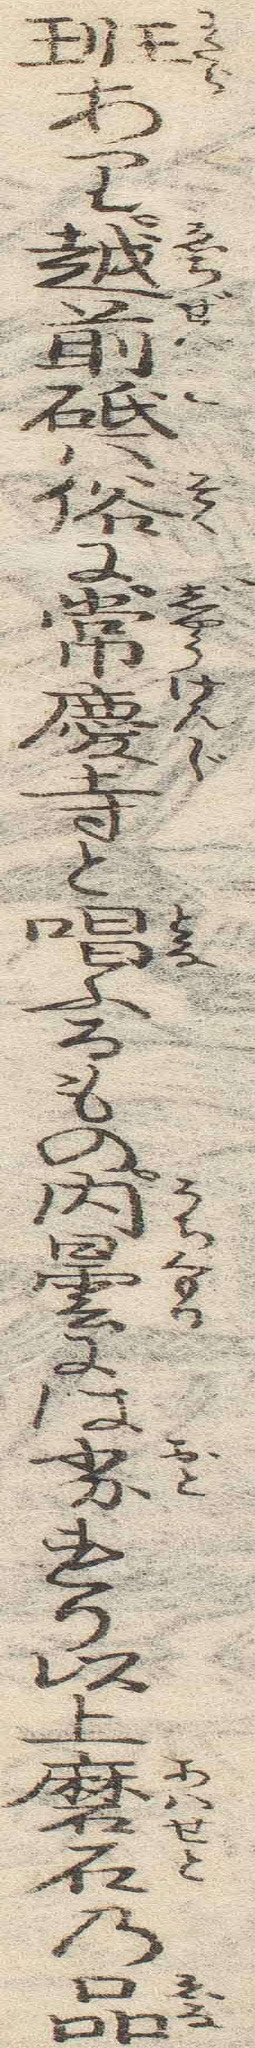班あり。越前砥は俗に常慶寺と唱ふるもの。内曇には劣れり以上磨石の品
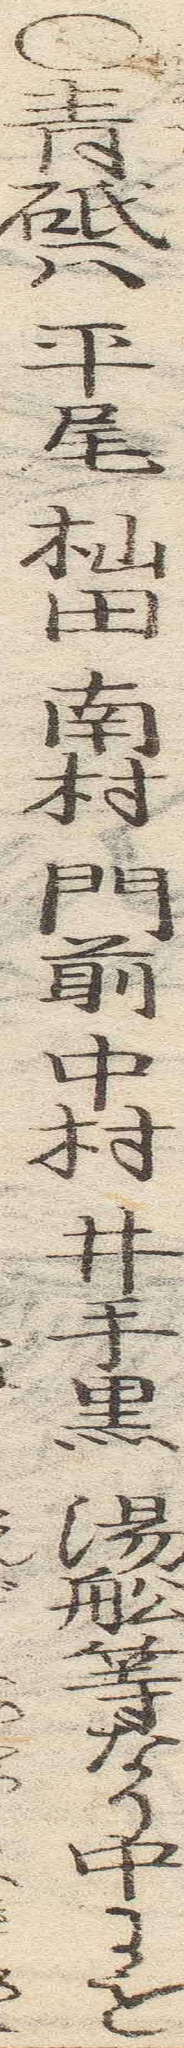○青砥は平尾杣田南村門前中村井手黒湯船等なり中にも
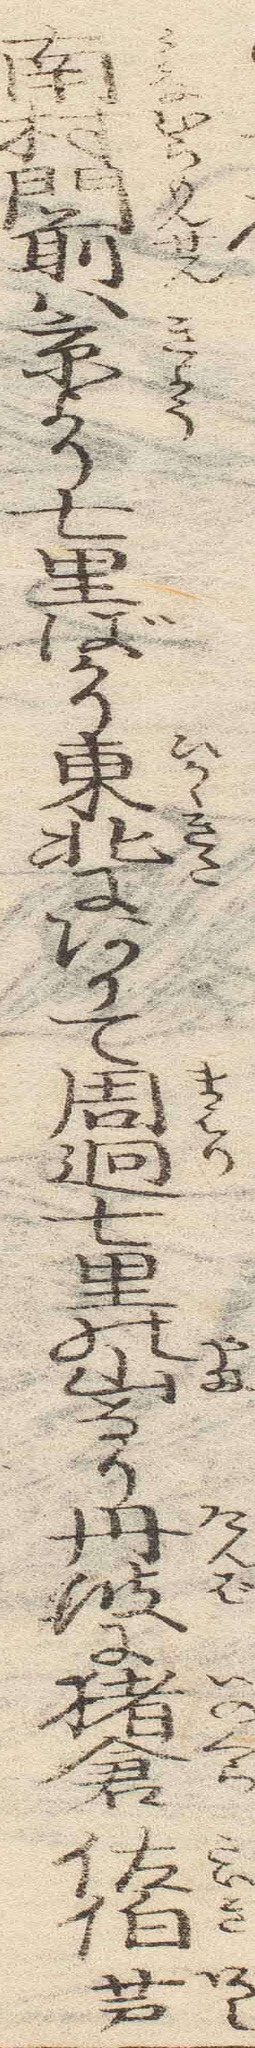南村門前は京より七里ばかり東北にありて周廻七里の山なり丹波に猪倉佐伯芦
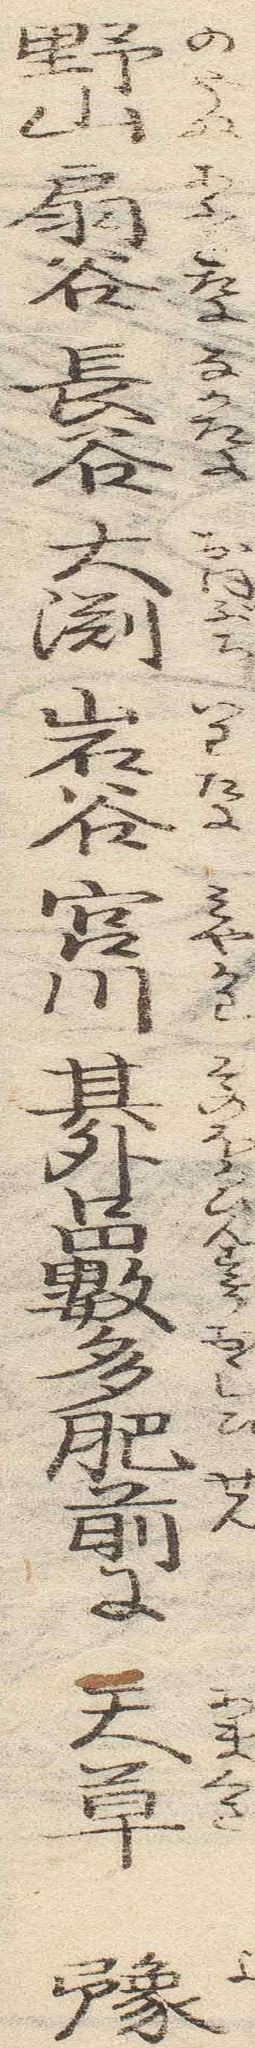野山扇谷長谷大渕岩谷宮川其外品数多肥前に天草予
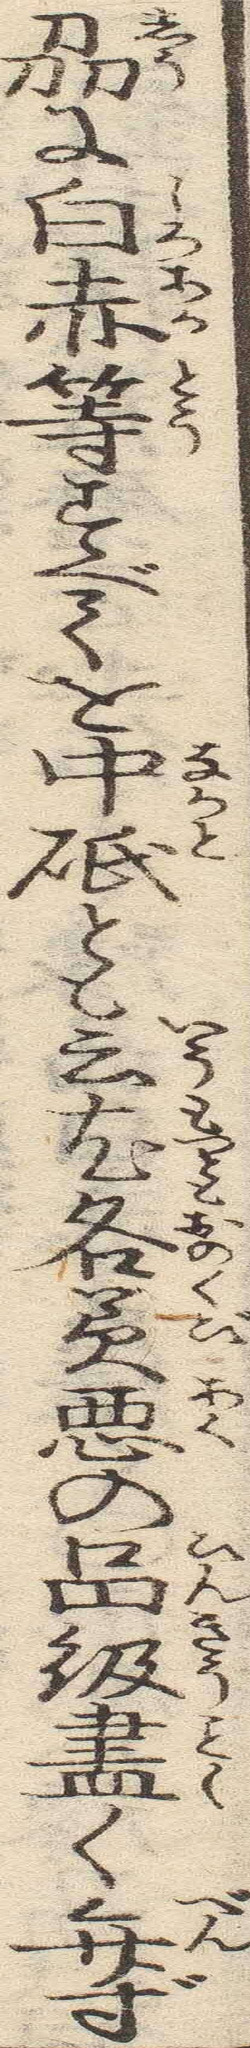州に白赤等すべてを中砥とも云尤各美悪の品級尽く弁ず
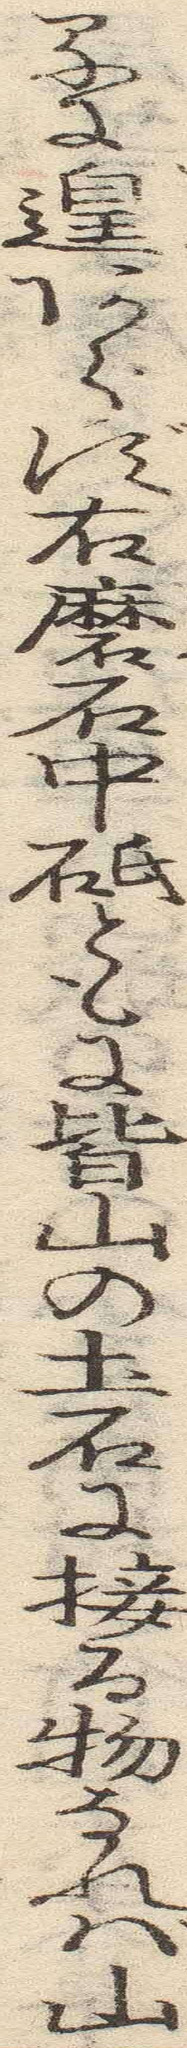るに遑あらず右磨石中砥ともに皆山の土石に接る物なれば山
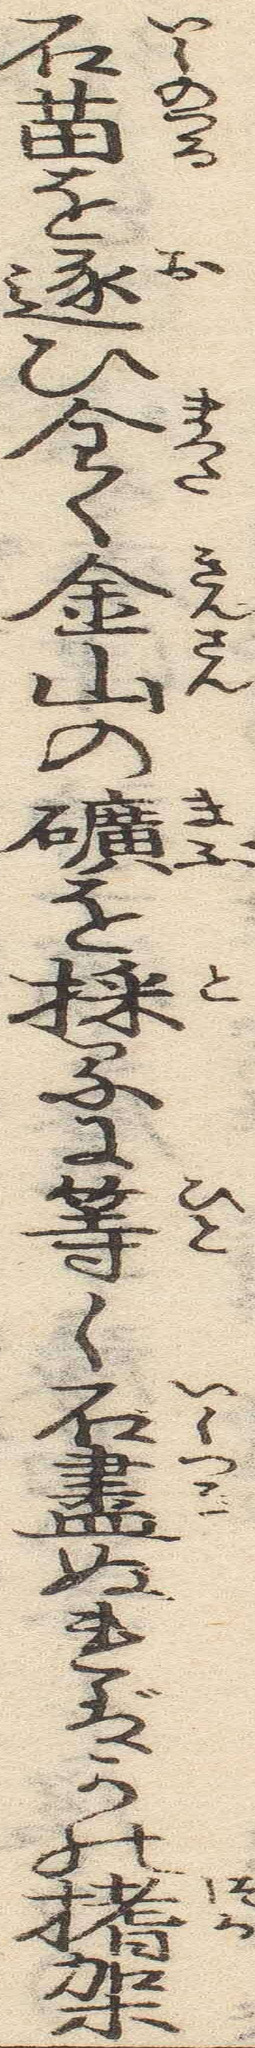石苗を逐ひ全く金山の礦を採るに等し石尽ぬればかの榰架
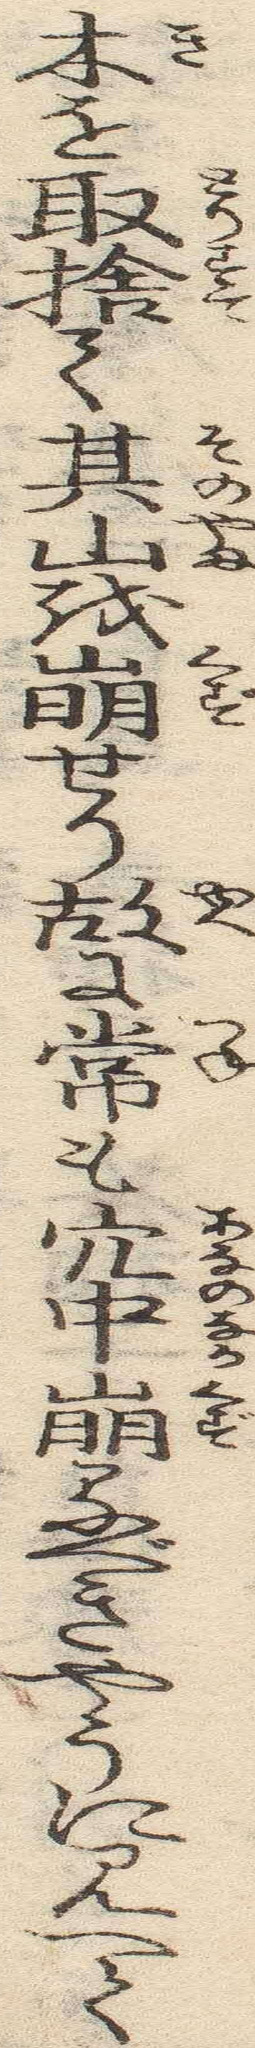木を取捨て其山を崩せり故に常も穴中崩るべきやうに見へて
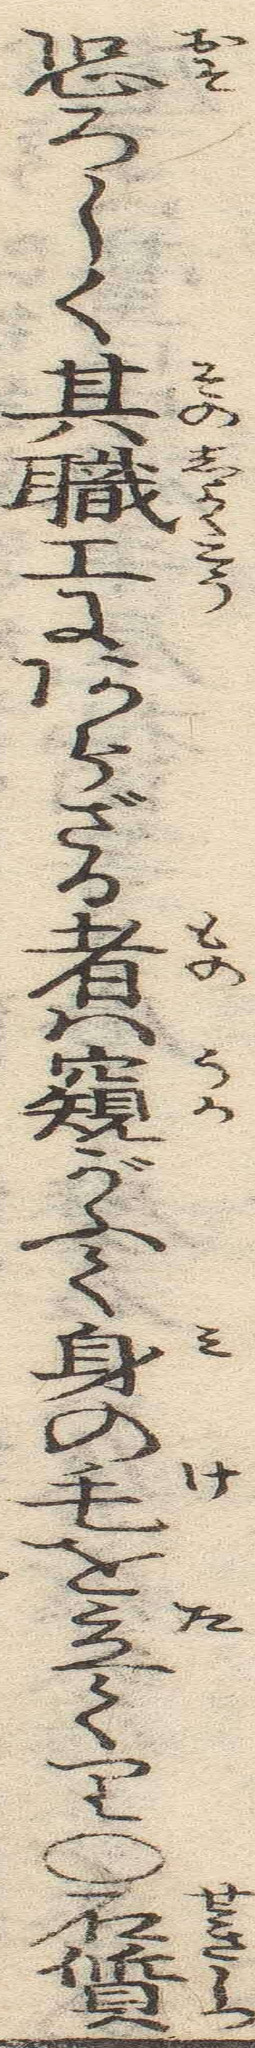恐ろしく其職工にあらざる者は窺がふて身の毛を立てり○石質
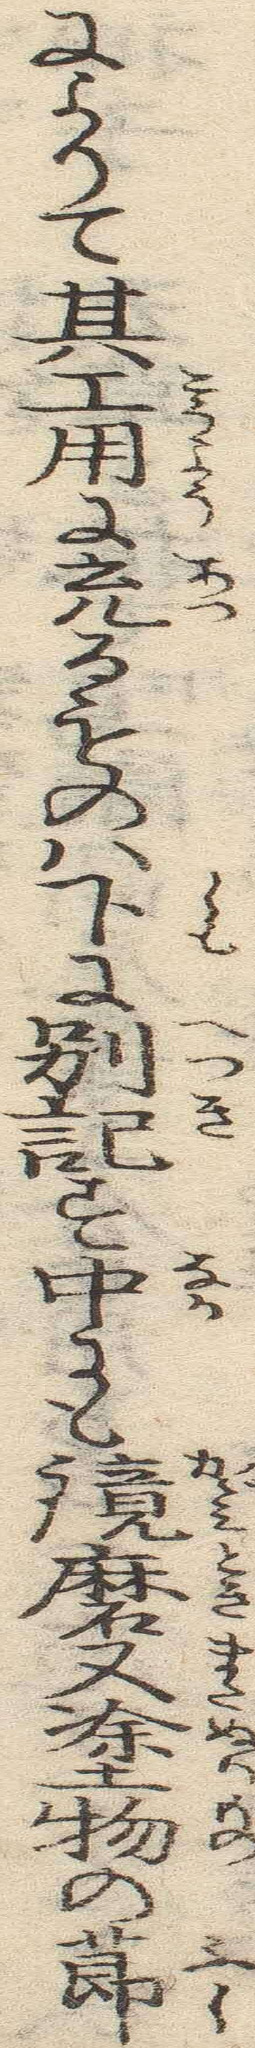によりて其工用に充るものは下に別記す中にも鏡磨又塗物の節
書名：日本山海名産図会
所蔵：東京学芸大学附属図書館 国文学研究資料館
